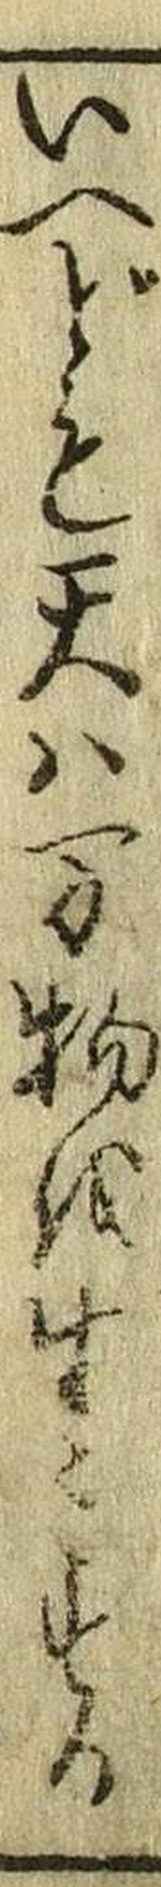いへども天は万物を生々する
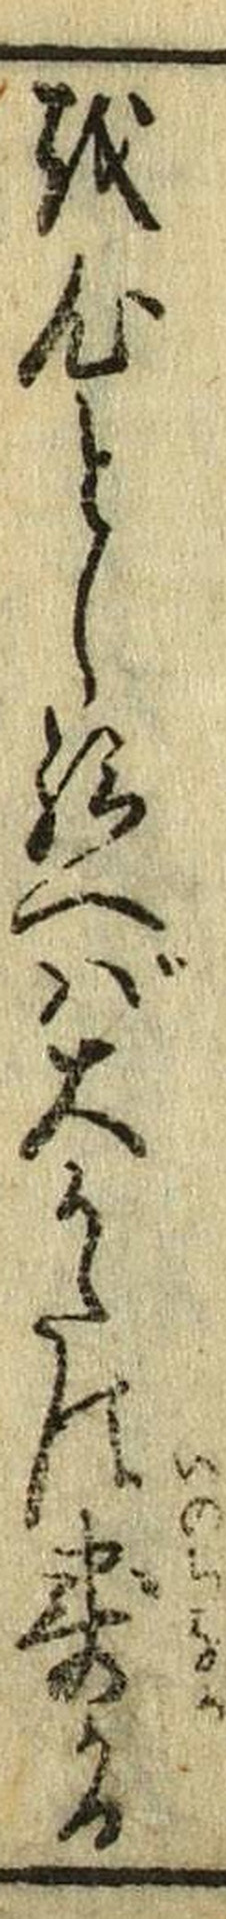を心とし給へば大かたは寿かる
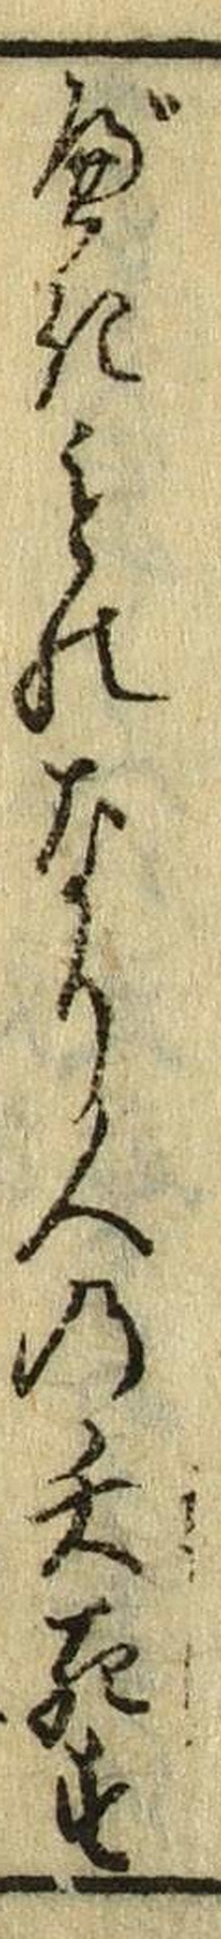べきものなり人の夭死す
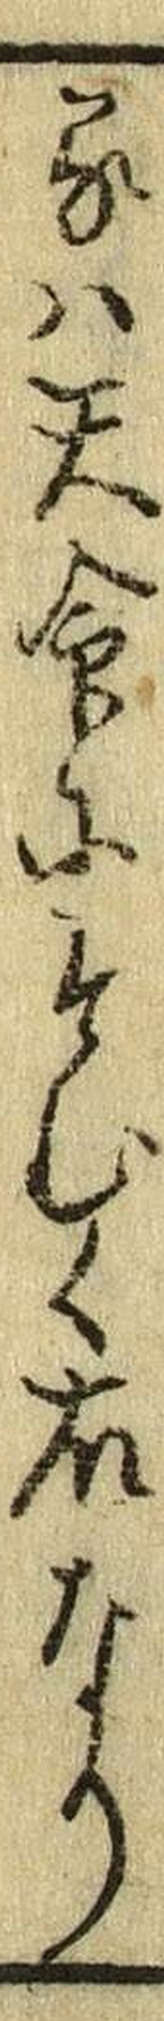るは天命にそむく故なり
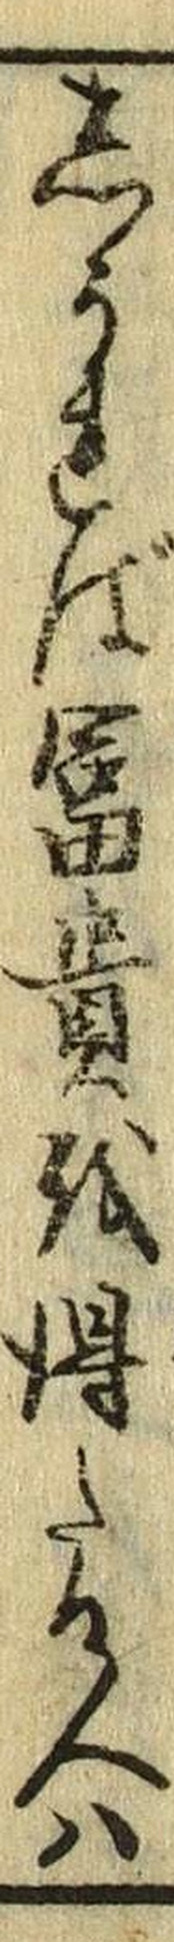しかれば富貴を得たる人は
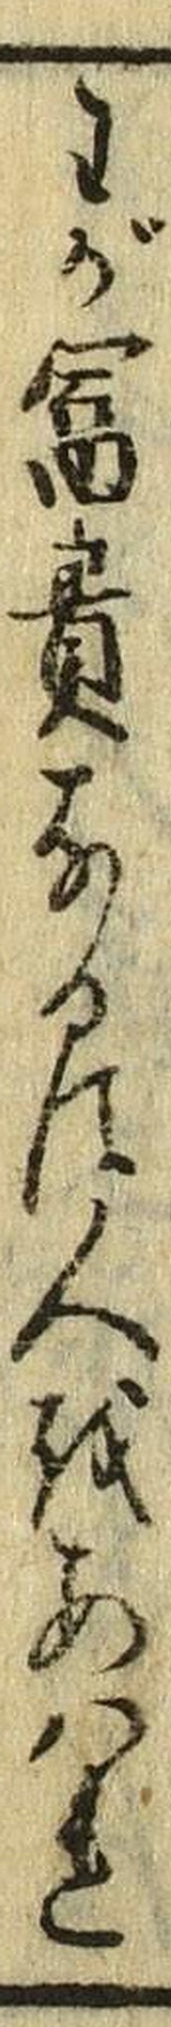わが富貴なるは人をあはれ
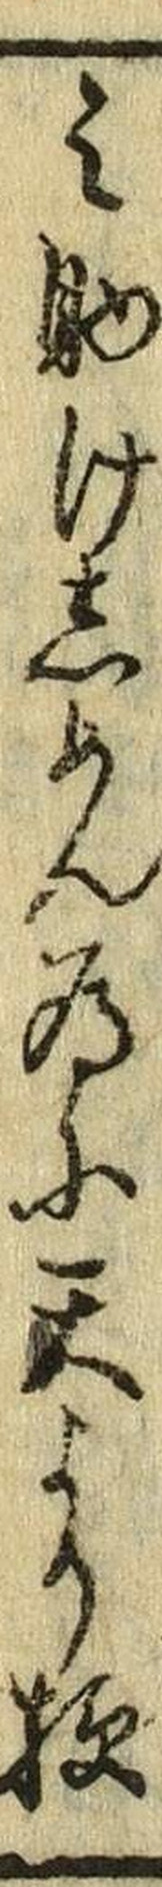み助けしめん為に天より授
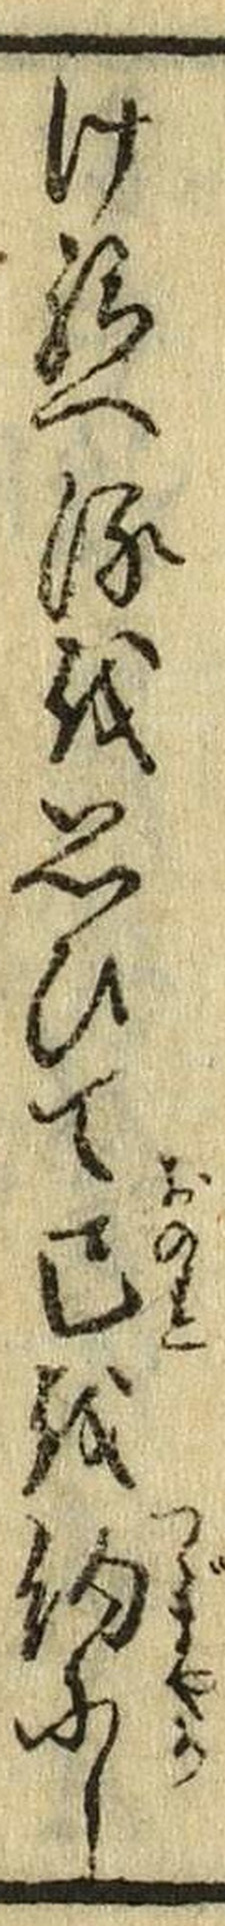け給へるを思ひて己を約にし
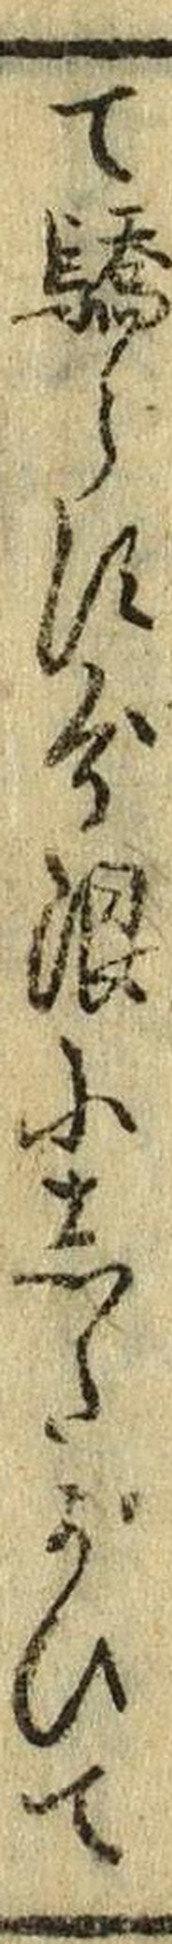て驕らす分限にしたがひて
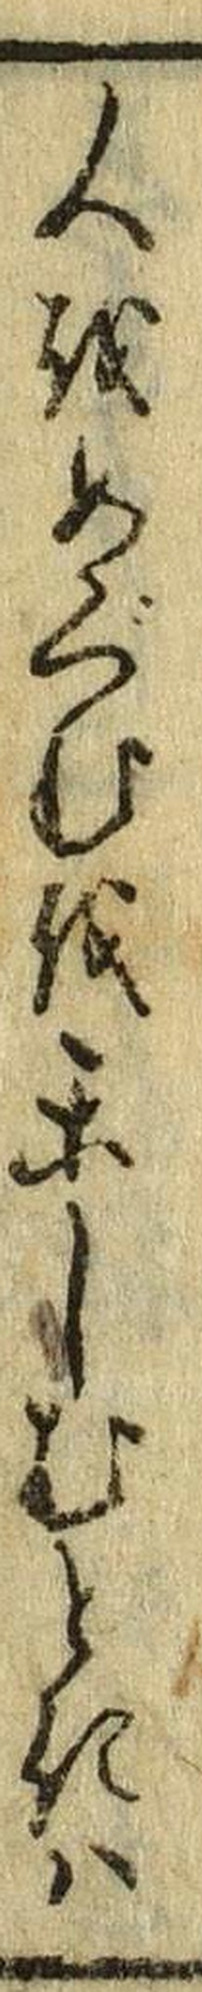人をめぐむを楽しむときは
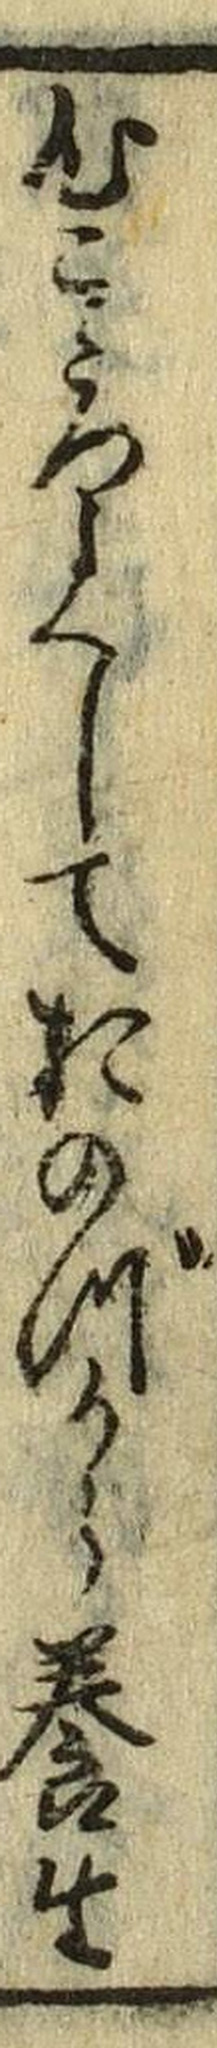心こころよくしておのづから養生
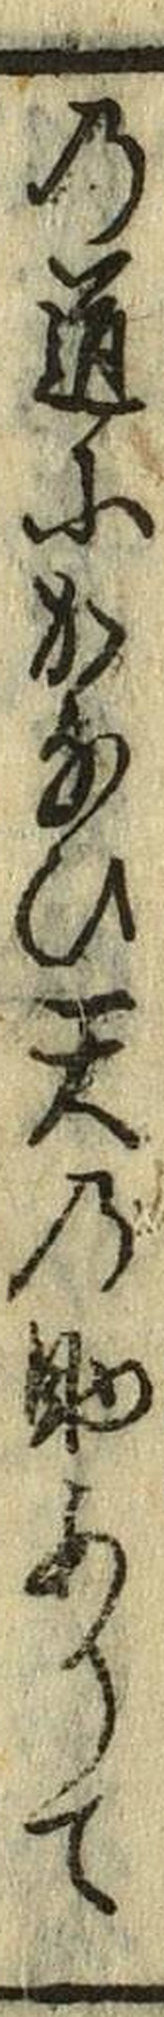の道にかなひ天の助ありて
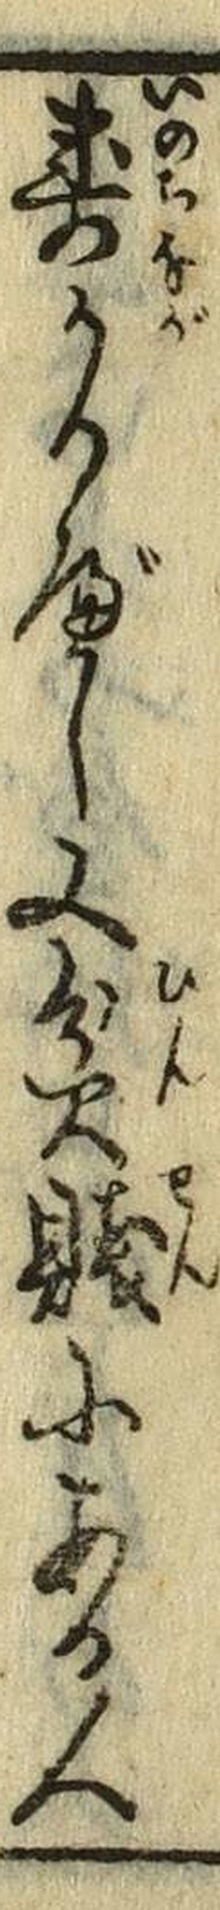寿かるべし又貧賤にある人
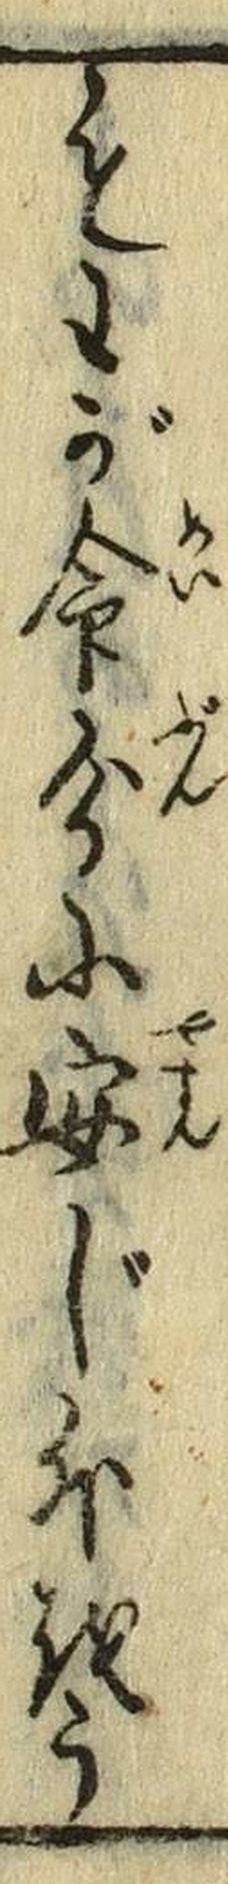もわが命分に安じ外をう
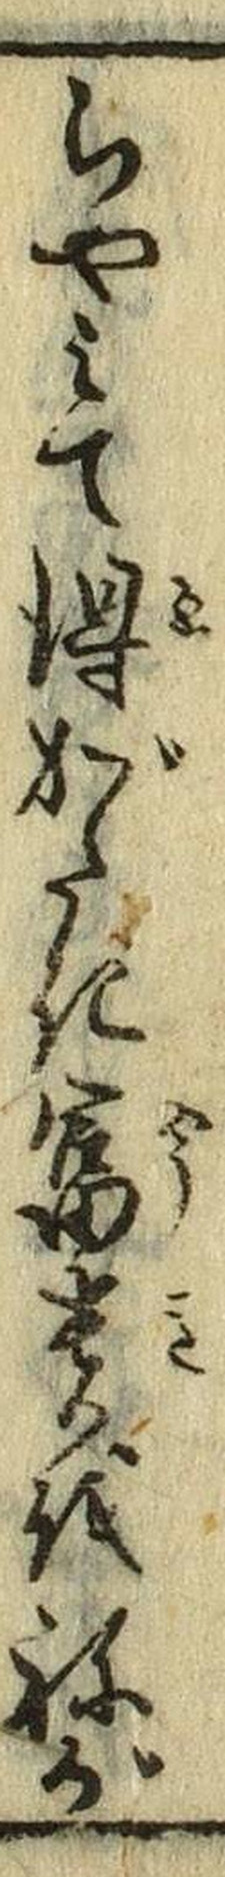らやみて得がたき富貴をねが
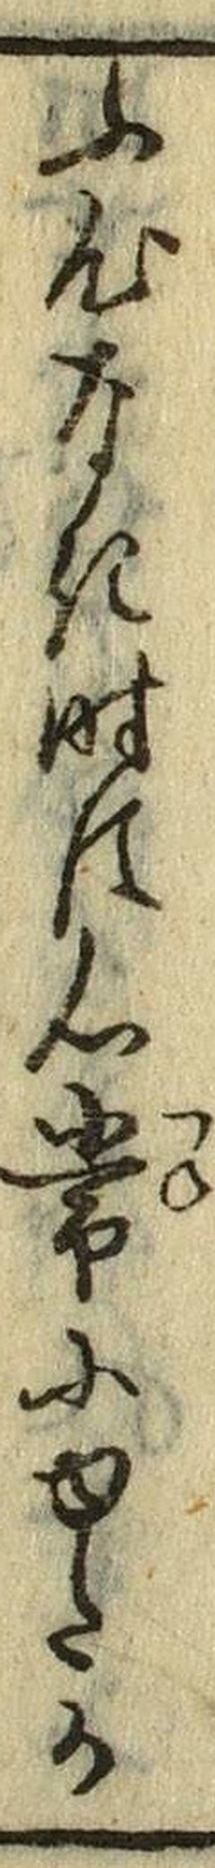ふ心なき時は心常にゆたか
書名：居家養生記
